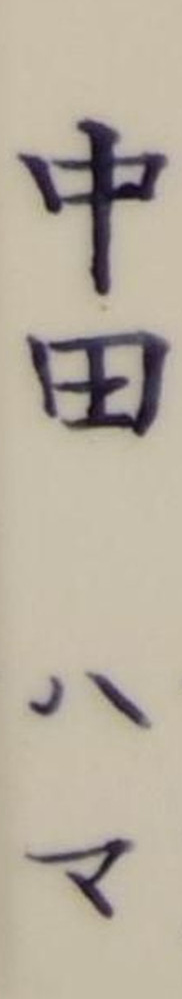中田ハマ

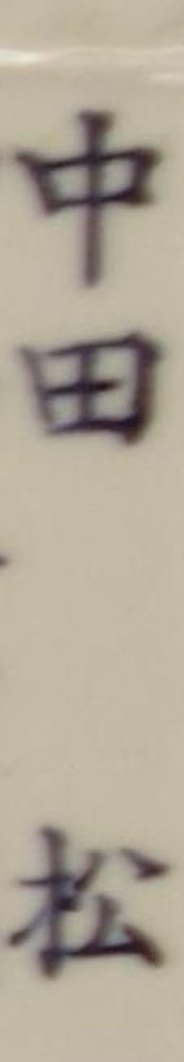中田松
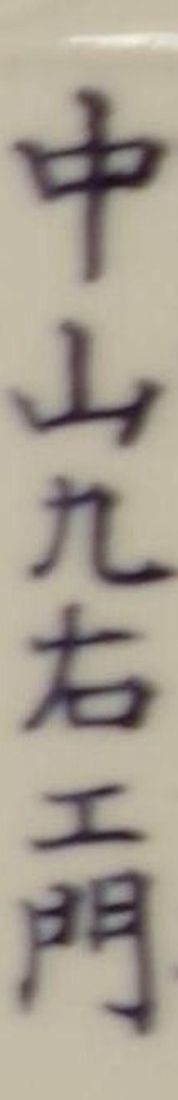中山九右エ門
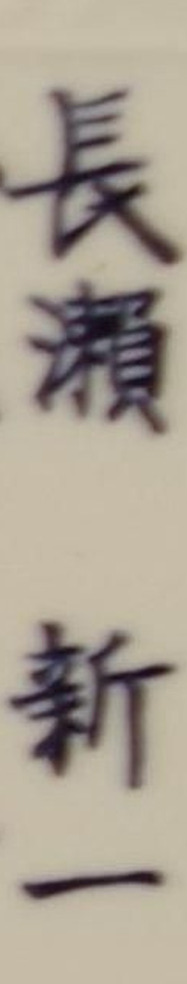長瀬新一
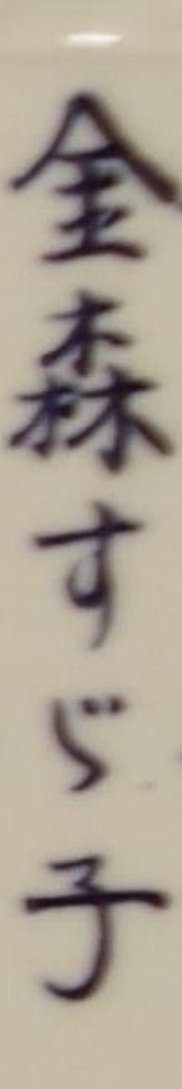金森すず子
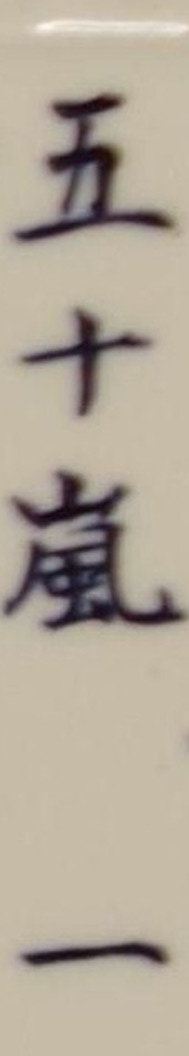五十嵐一
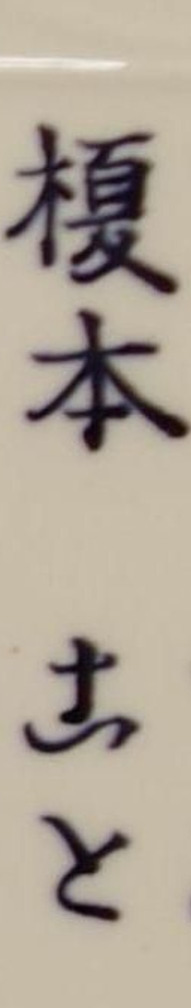榎本こと
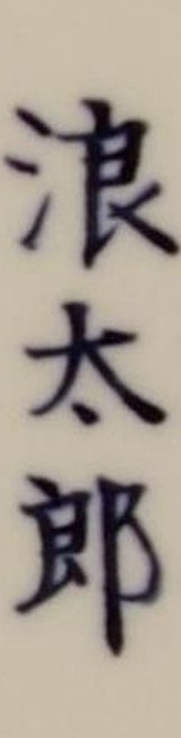浪太郎
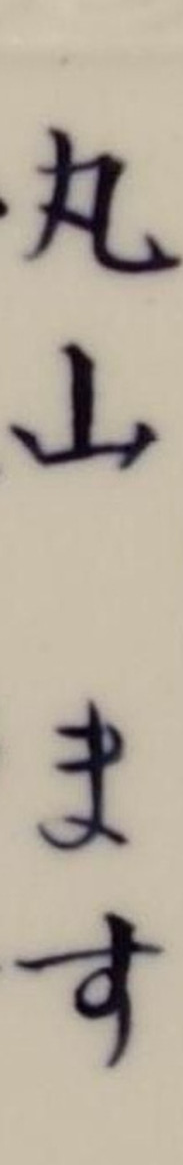丸山ます
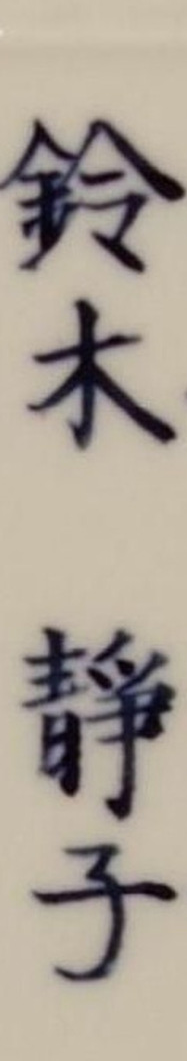鈴木静子
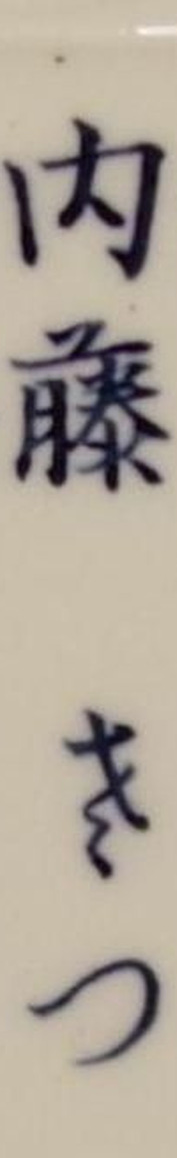内藤さつ
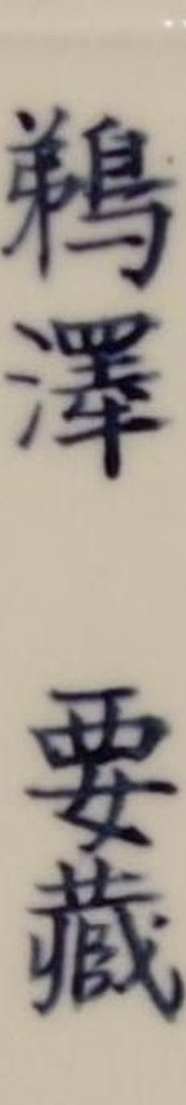鵜澤要蔵
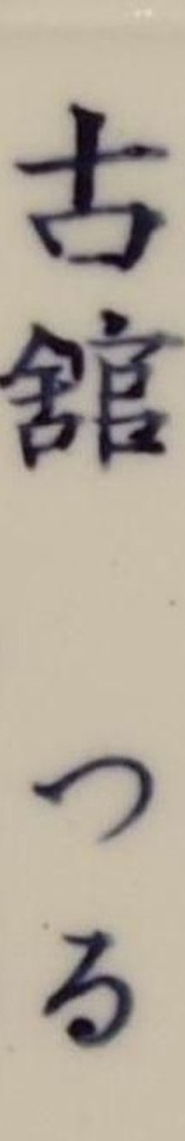古館つる
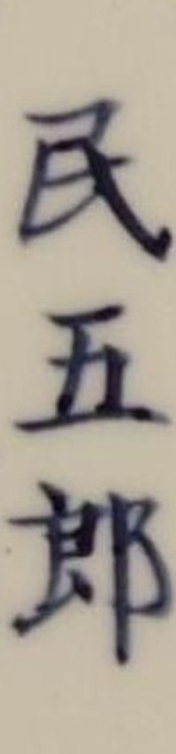民五郎
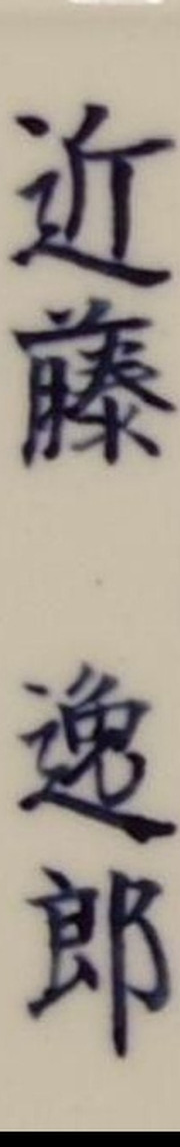近藤逸郎
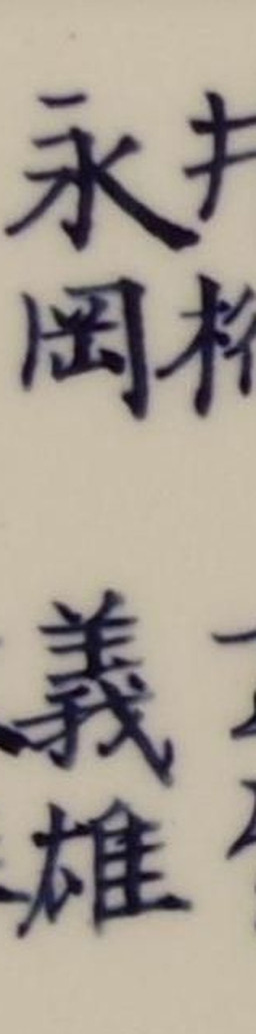永岡義雄
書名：M~S
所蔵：高野山金剛峯寺
